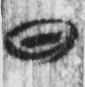日
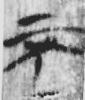不
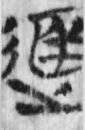𬨭（將）
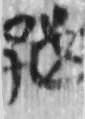○（越）
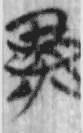異
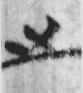之
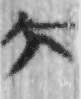大
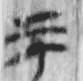帀（師）
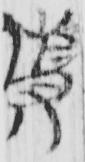儥
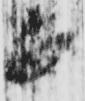㠯（以）
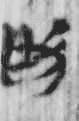○（廷）
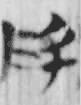阩
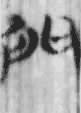門
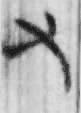又
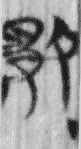敗
